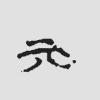亓（其）
